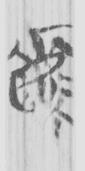{每糸}
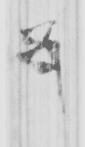邑
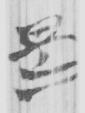是
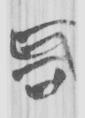{㠯ㅋ}
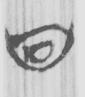昌
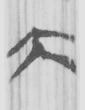大
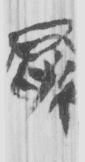縵
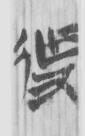{彳乍又}
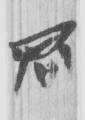君
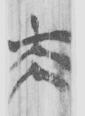夫
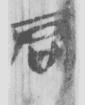君
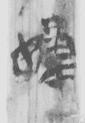婦
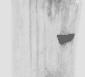一
